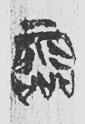霝
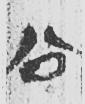公
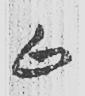㠯（以）
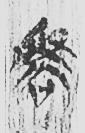唬
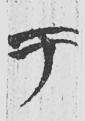于
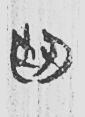廷
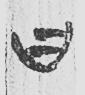曰
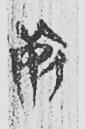死
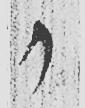人
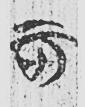可
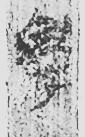辠
